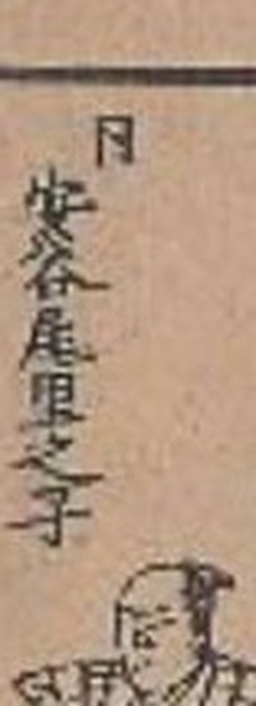安谷尾里之子
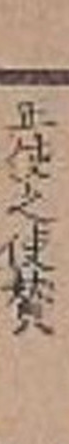正使之使賛
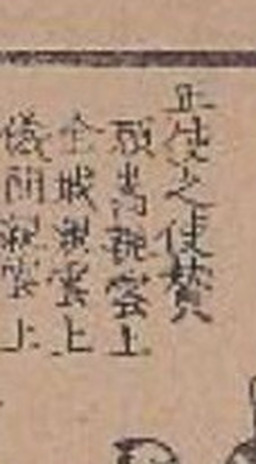瀬嵩親雲上
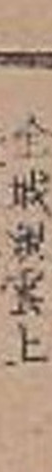金城親雲上
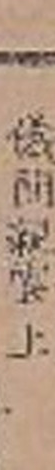儀間親雲上
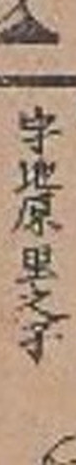宇地原里之子

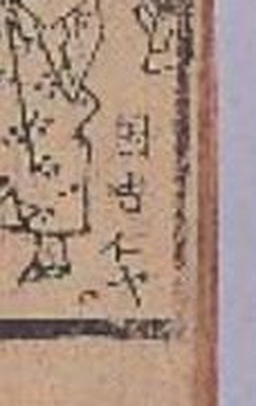国吉仁ヤ
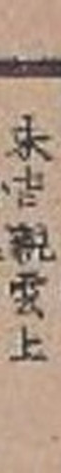末吉親雲上
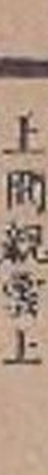上間親雲上
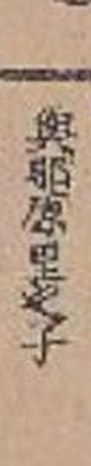與那原里之子
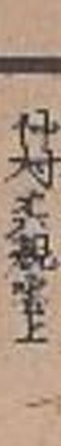仲村渠親雲上
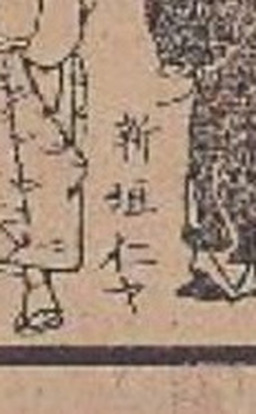新垣仁ヤ
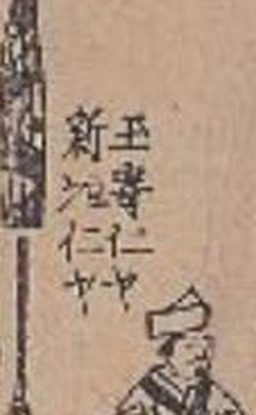玉寄仁ヤ
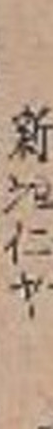新垣仁ヤ
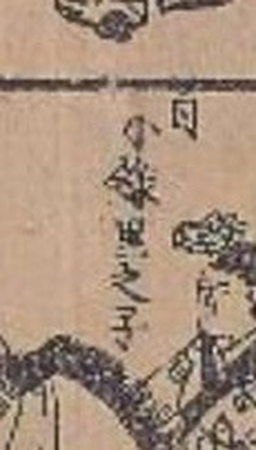小録里之子
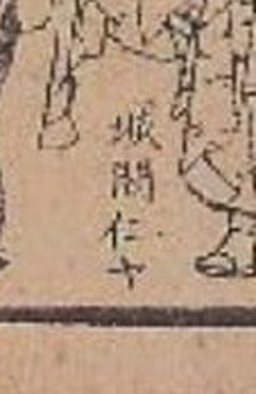城間仁ヤ
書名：琉球人行列附 嘉永三庚戌年十一月
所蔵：University of the Ryukyus Library
